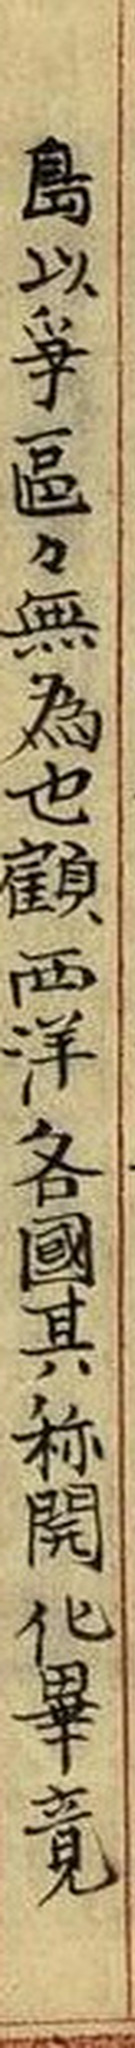島以争区々無為也顧西洋各国其称開化畢竟
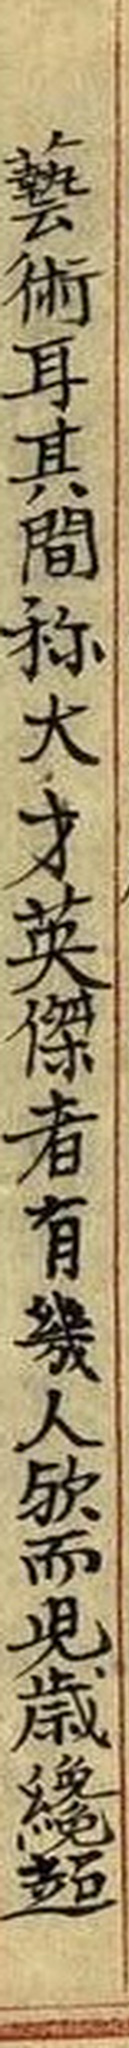芸術耳其間称大才英傑者有幾人歟而児歳纔超
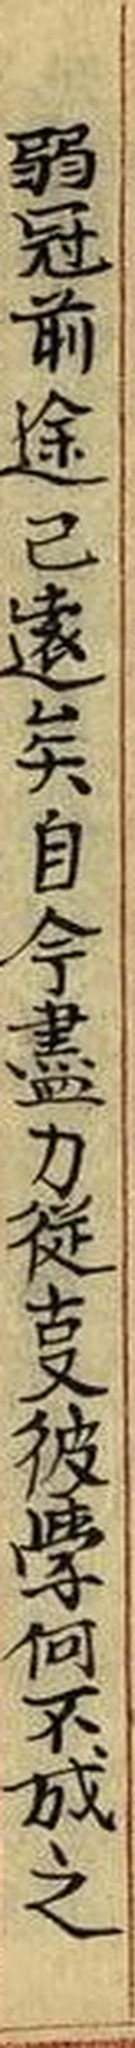弱冠前途已遠矣自今尽力従事彼学何不成之
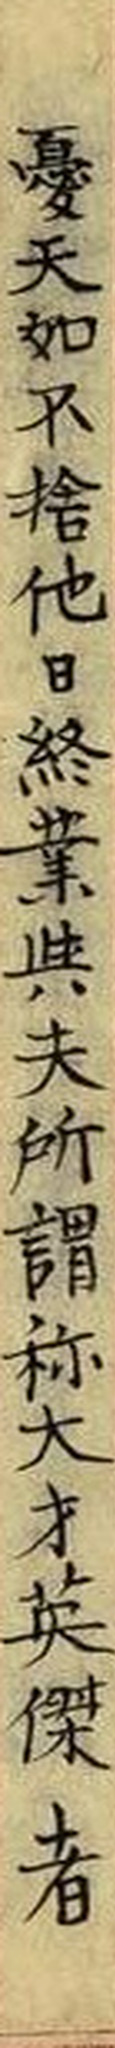憂天如不捨他日終業與夫所謂称大才英傑者
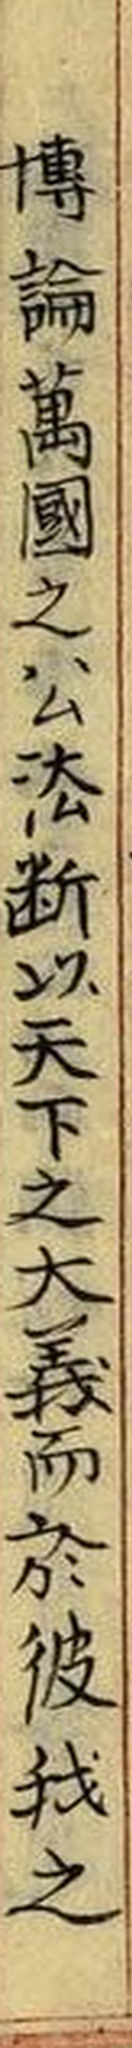博論万国之公法断以天下之大義而於彼我之
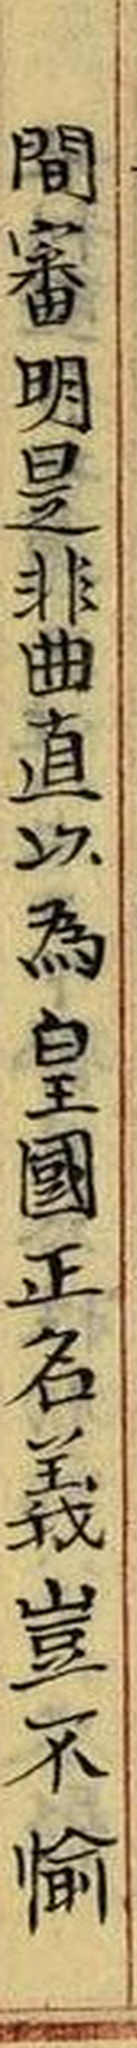間審明是非曲直以為皇国正名義豈不愉
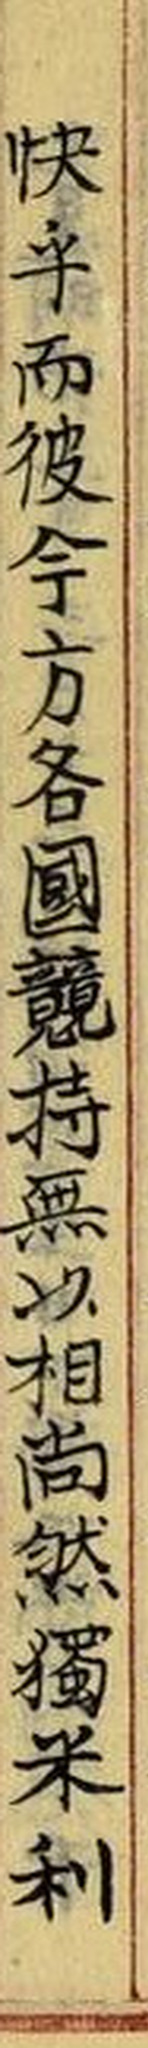快乎而彼今方各国競持無以相尚然独米利
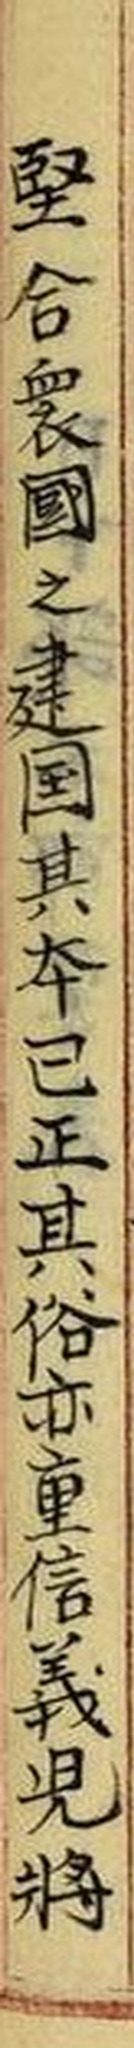堅合衆国之建国其本已正其俗亦重信義児将
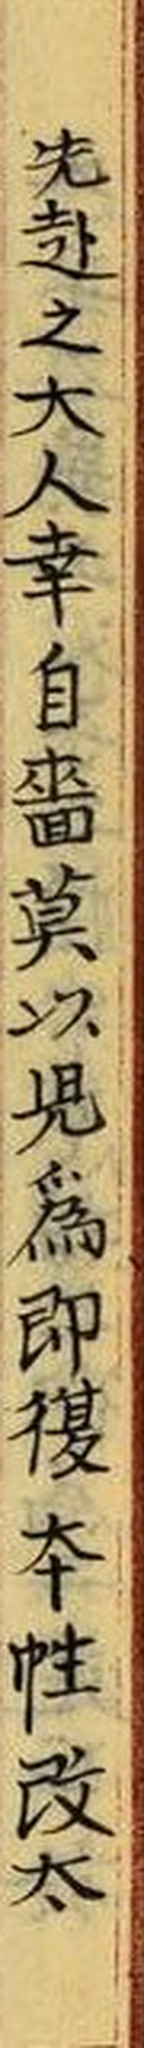先赴之大人幸自嗇莫以児為即復本性改太
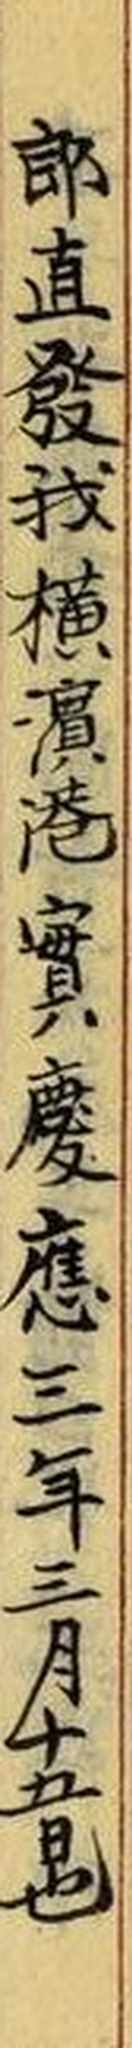郎直発我横浜港実慶応三年三月十五日也
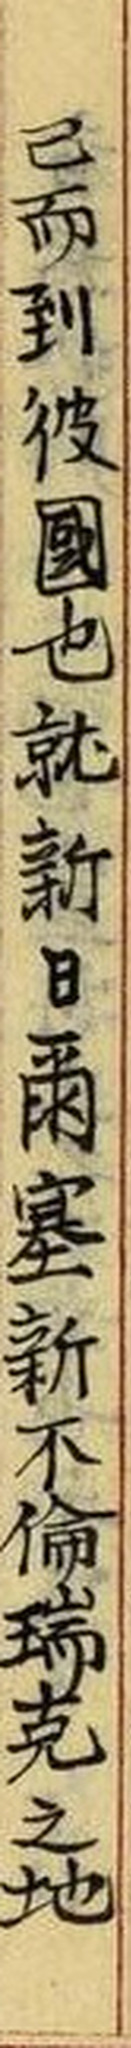已而到彼国也就新日爾塞新不倫瑞克之地
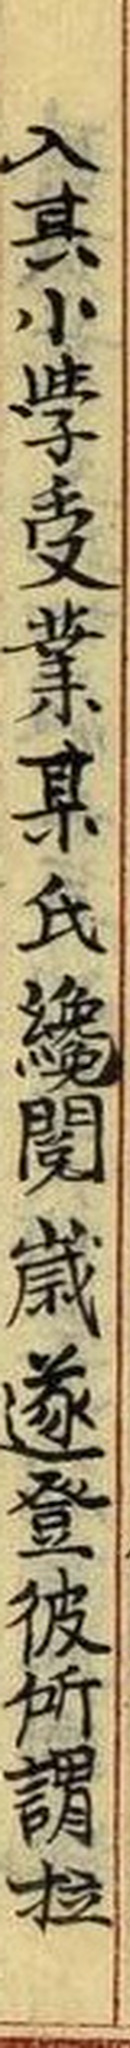入其小学受業某氏纔閲歳遂登彼所謂拉
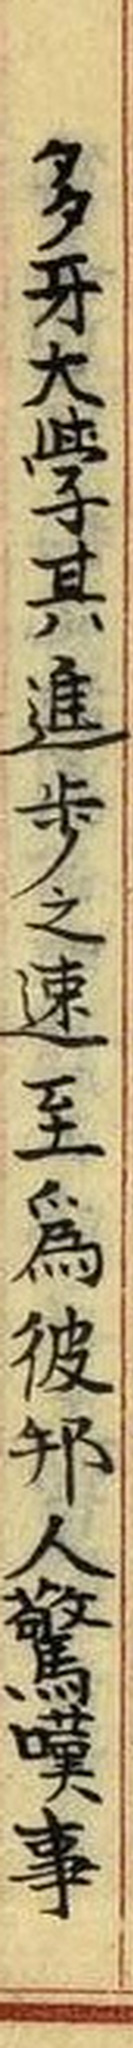多牙大学其進歩之速至為彼邦人驚嘆事
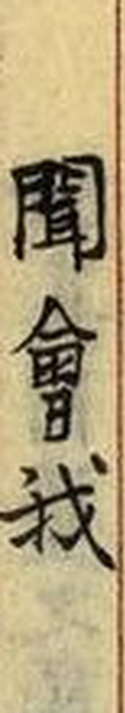聞会我
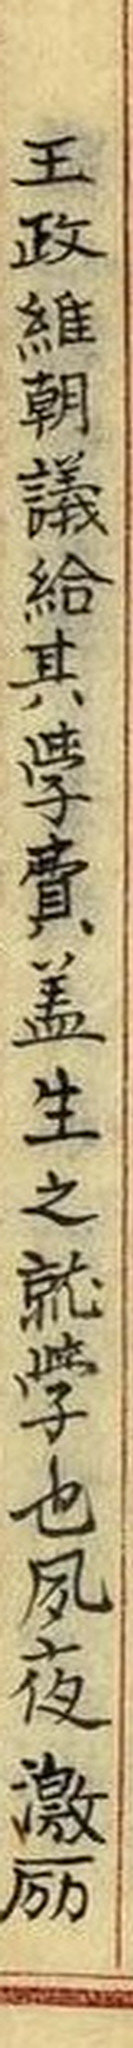王政維朝議給其学費蓋生之就学也夙夜激励
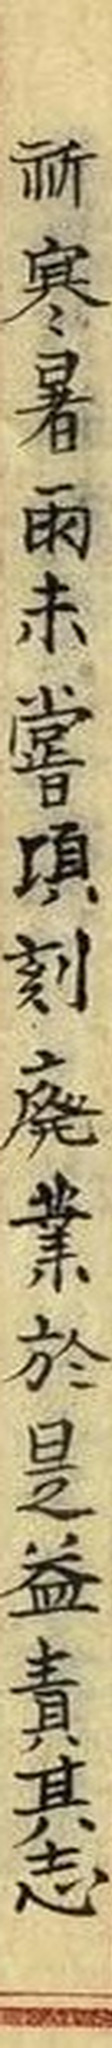祈寒暑雨未嘗頃刻廃業於是益責其志
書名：温古集 三巻
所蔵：福井県文書館 Fukui Prefectural Archives
